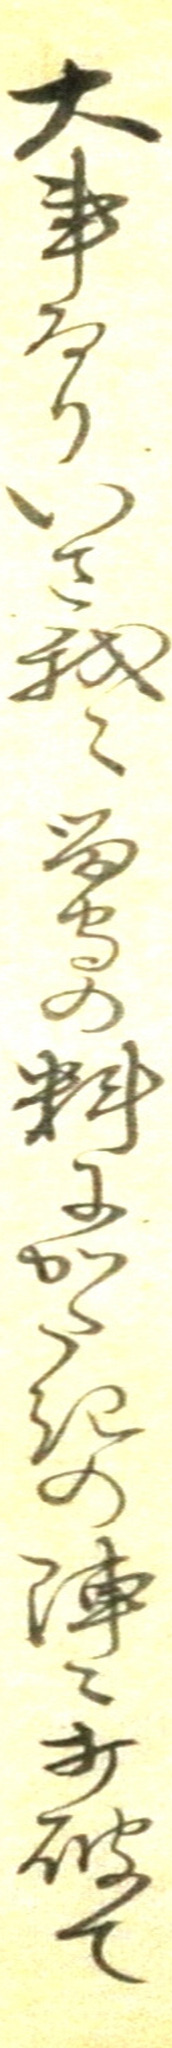大事なりいさ我々留守の料にかたきの陣々打破て
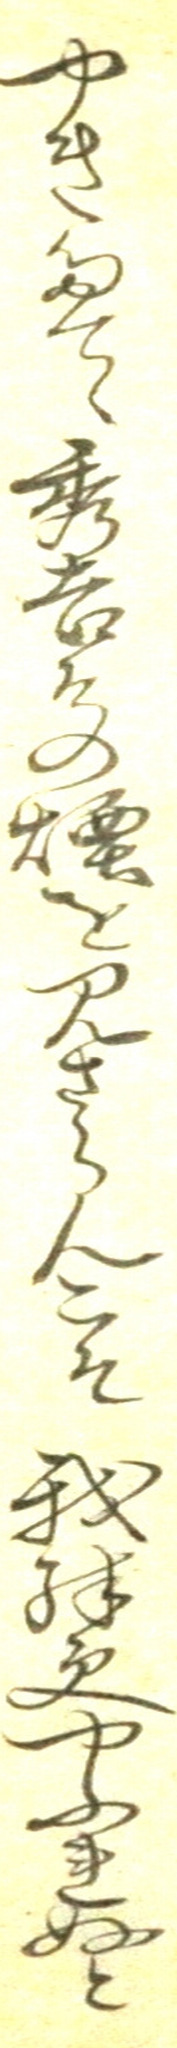やきたてゝ秀吉その煙を見さらんこそ我殊更やふれぬと
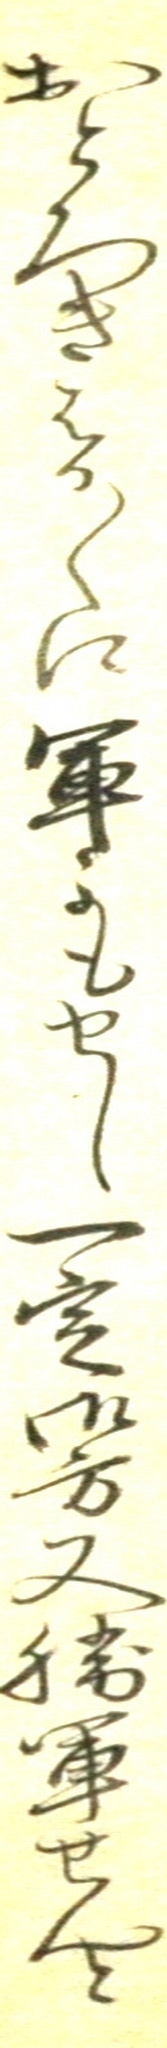おとろきはる〳〵に軍にもせし一定御方又勝軍せんと
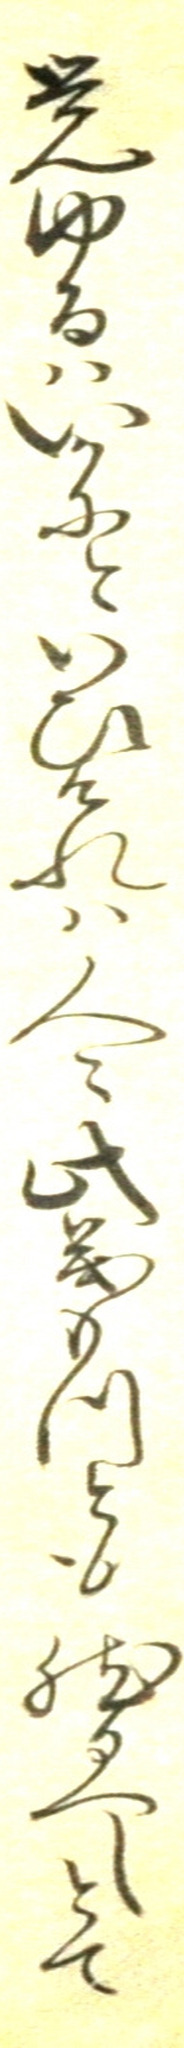覚ゆるはいかにといひけれは人々此ももつとも然るへしとて
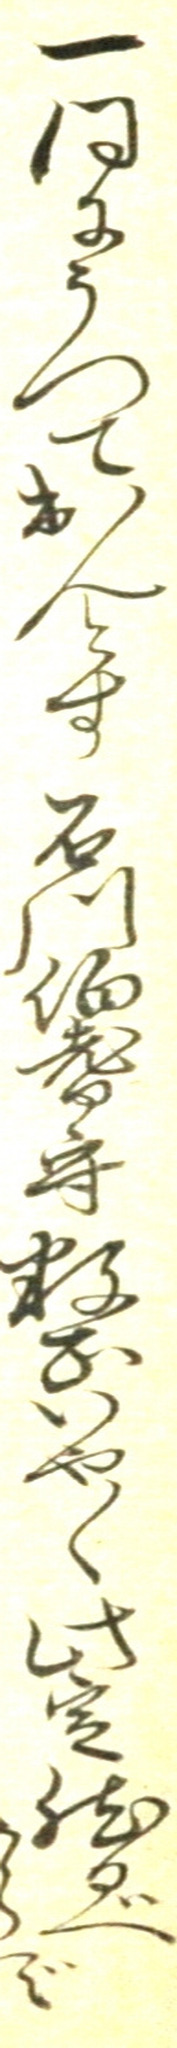一同にうつて出んとす石川伯耆守数正いや〳〵此定然るべからず
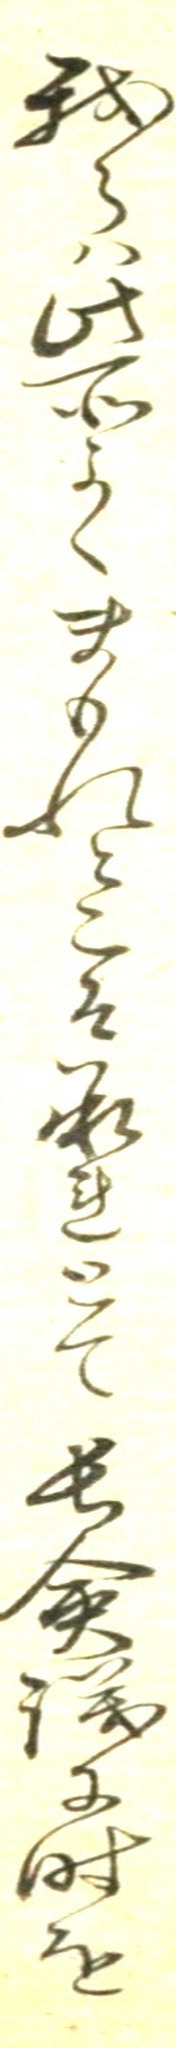我らは此所よくまもれとこそ承れとて長僉議に時を
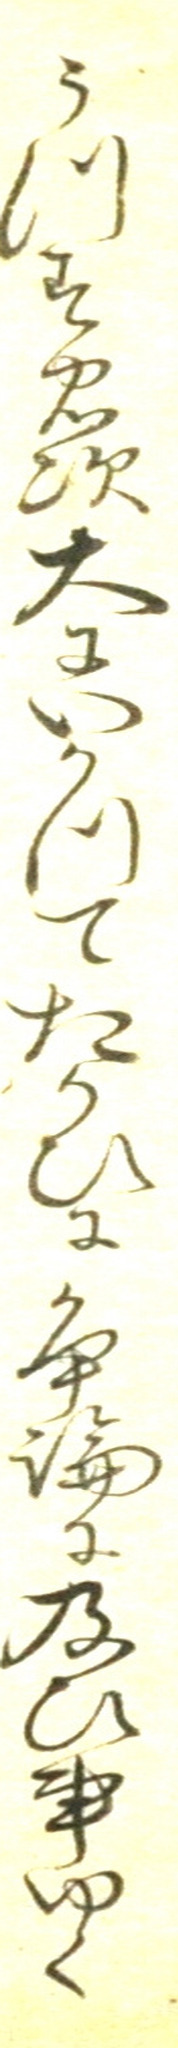うつす忠次大にいかつてたかひに争論に及ひ事ゆく
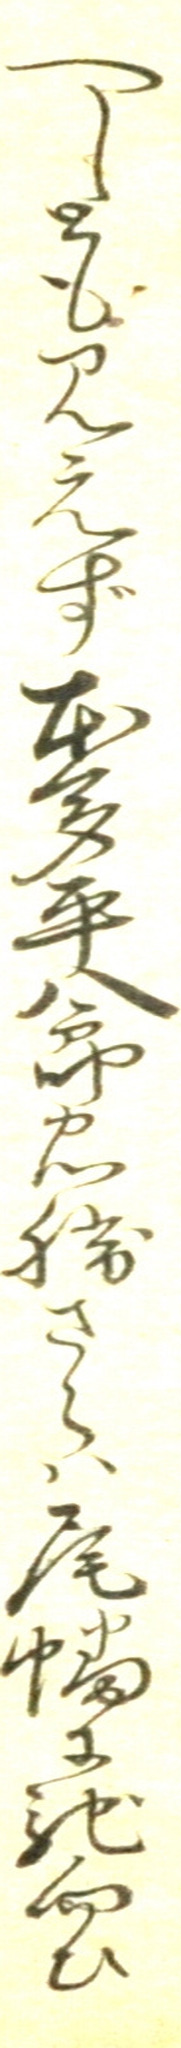へしとも見えず本多平八郎忠勝さらは尾幡に馳向ひ
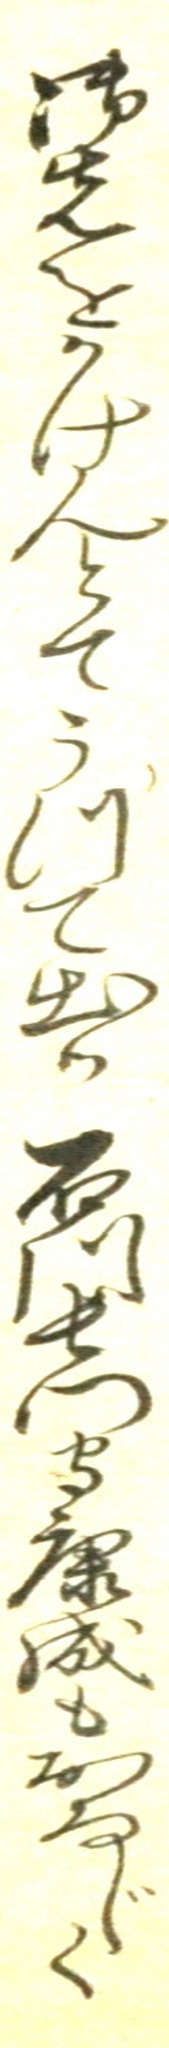御先をかけんとてうつて出ッ石川長門守康成もおなじく
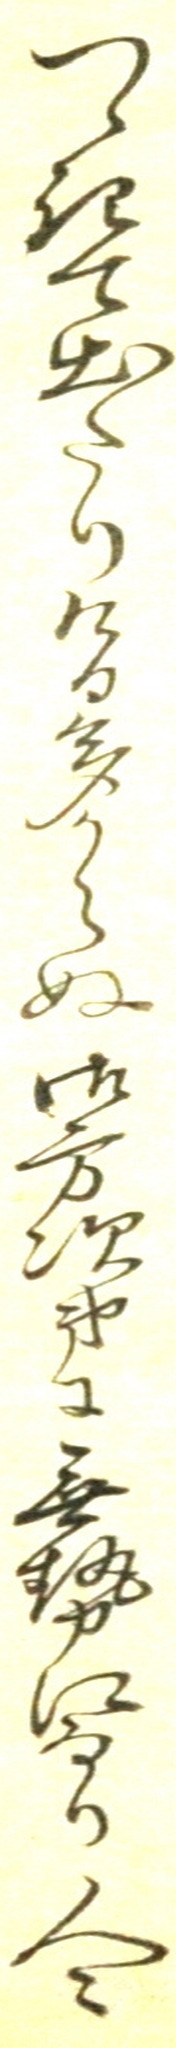つゝきて出たりける多からぬ御方次第に無勢になり人々
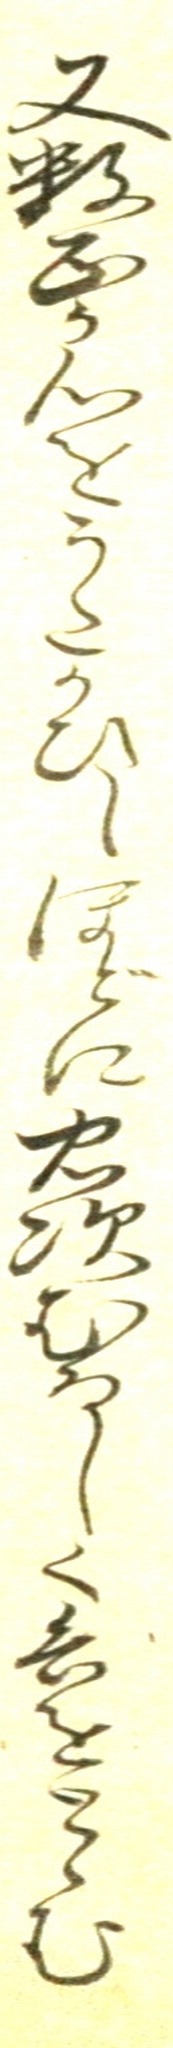又数正か心をうたかひしほどに忠次むなしく兵をとゝむ
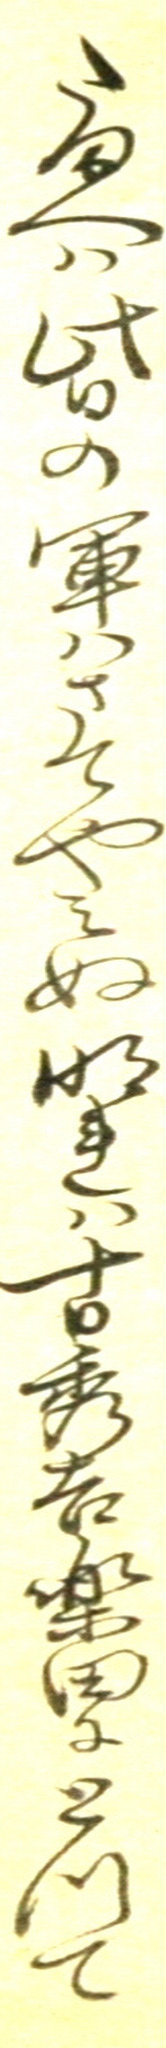たまへは此日の軍はさてやみぬ明れは十日秀吉楽田にとつて
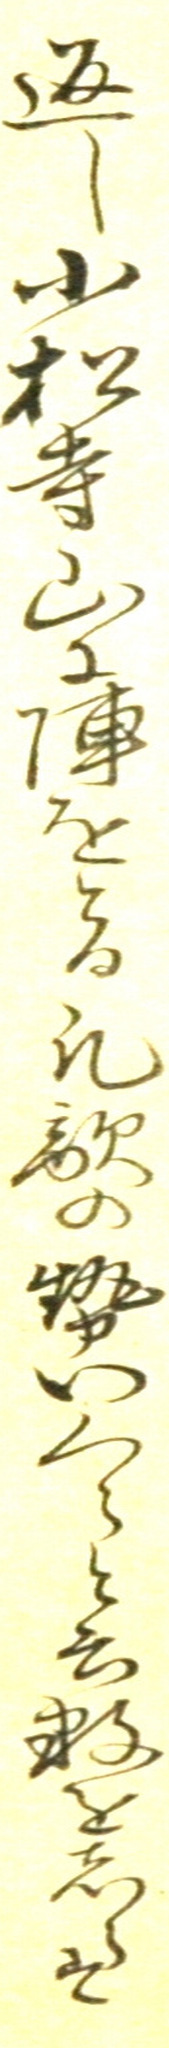返し小松寺山に陣をとる凡敵の勢いくらと云数をしらす

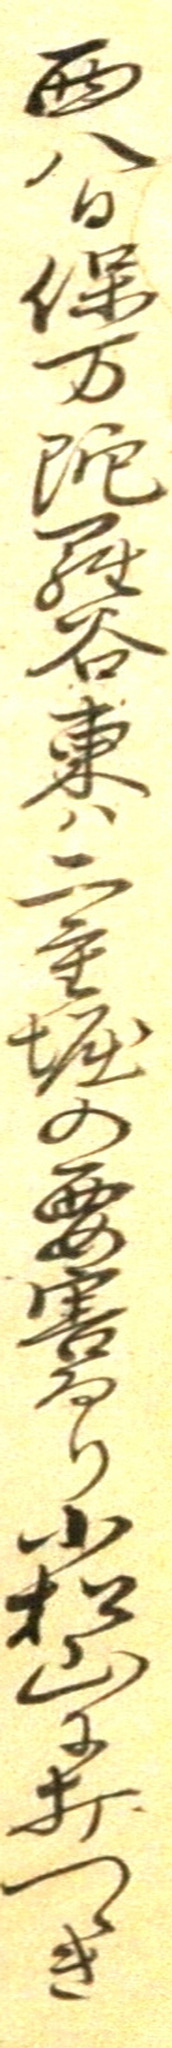西は日保万陀羅谷東は二重堀の要害なり小松山に打つゝき
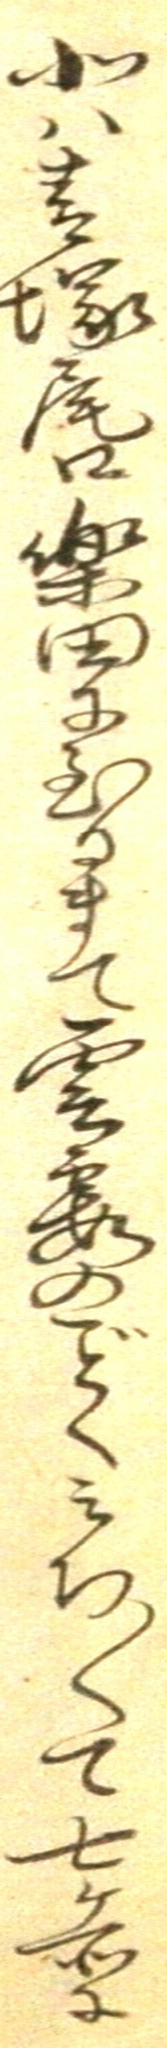北は青塚尾口楽田に至るまて雲霞のごとくみち〳〵て七ヶ所に
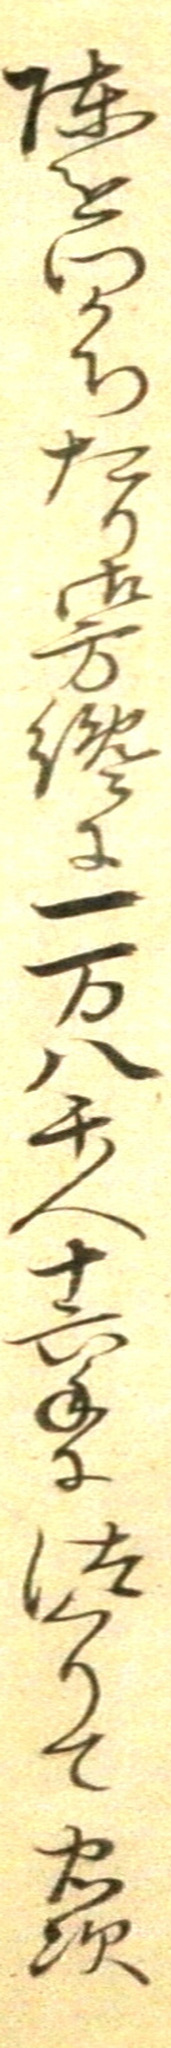陣をわかちたり御方纔に一万八千人十六手につくりて忠次
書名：藩翰譜（四・上）
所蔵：伊那市立高遠町図書館・合同会社AMANE
